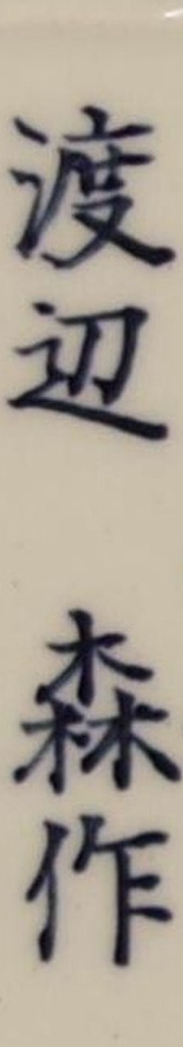渡辺森作
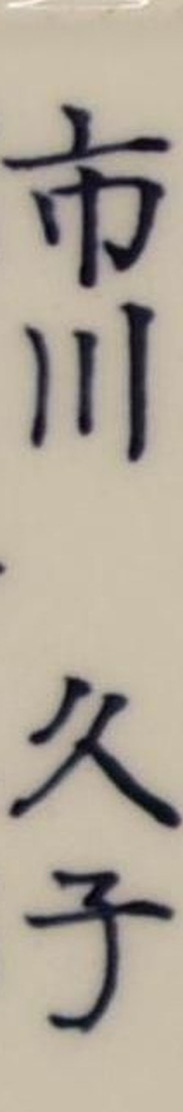市川久子
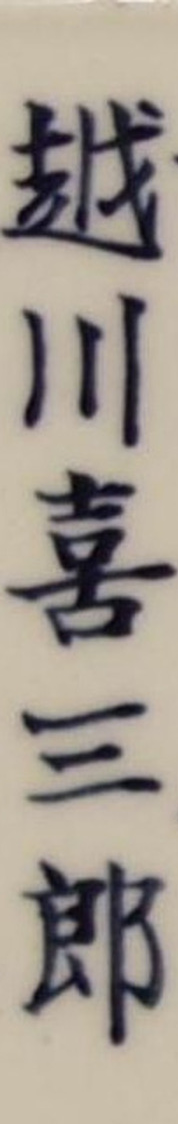越川喜三郎
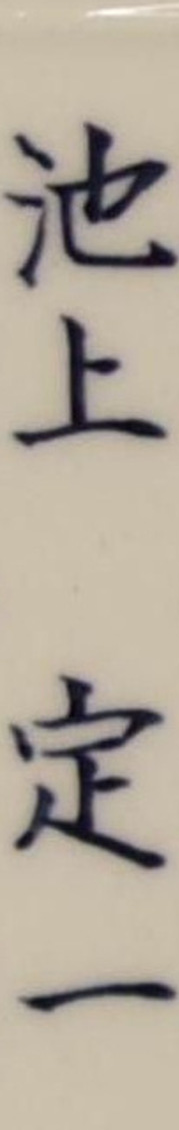池上定一
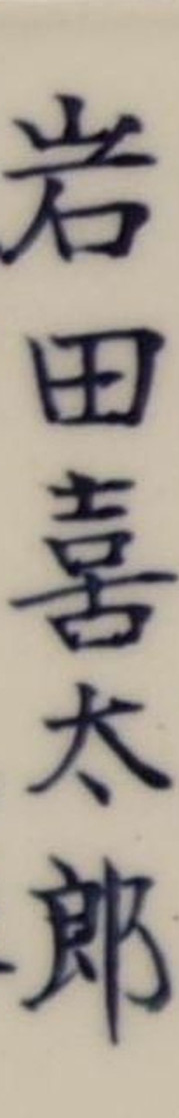岩田喜太郎
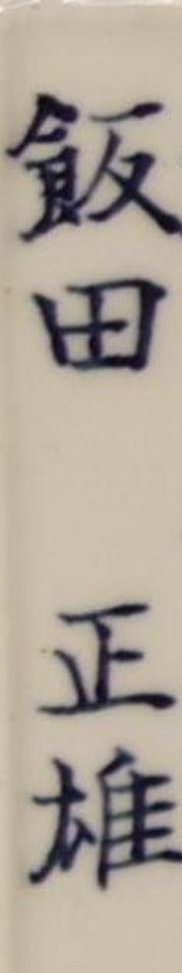飯田正雄

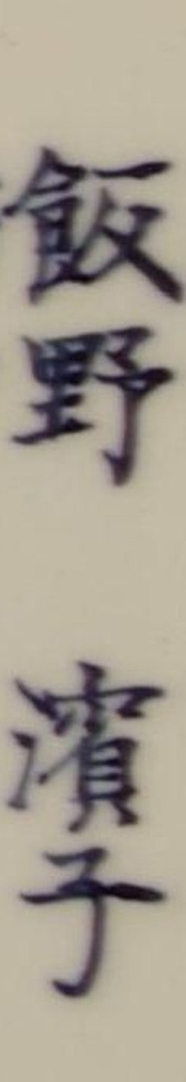飯野濱子
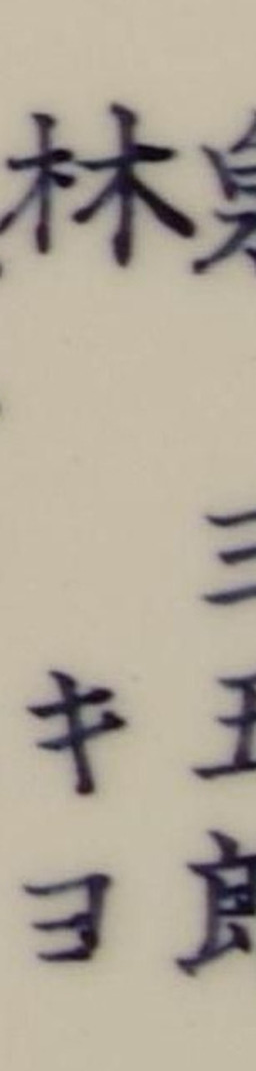林キヨ
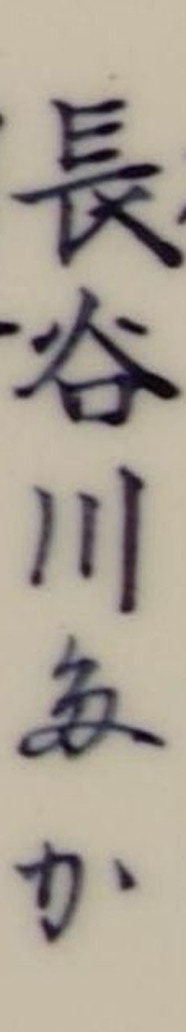長谷川たか
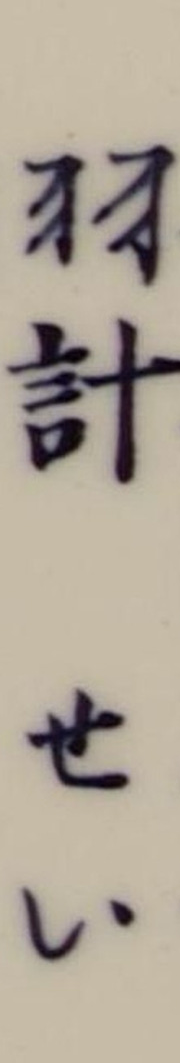羽計せい
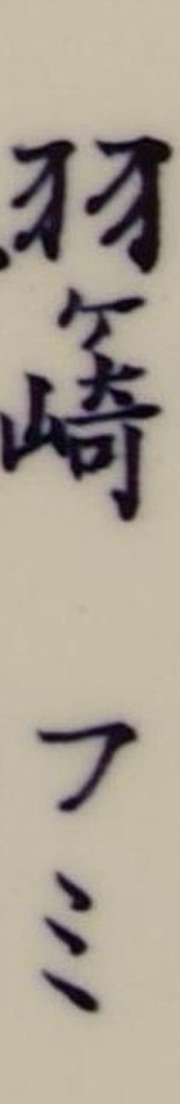羽ケ崎フミ
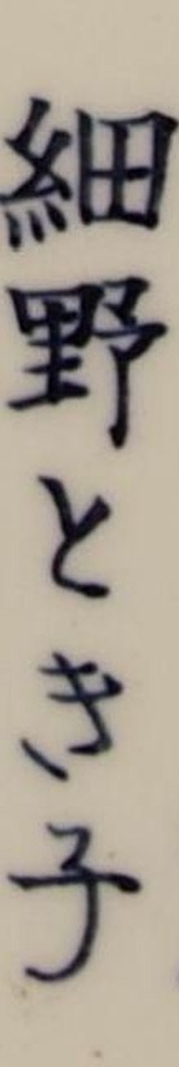細野とき子
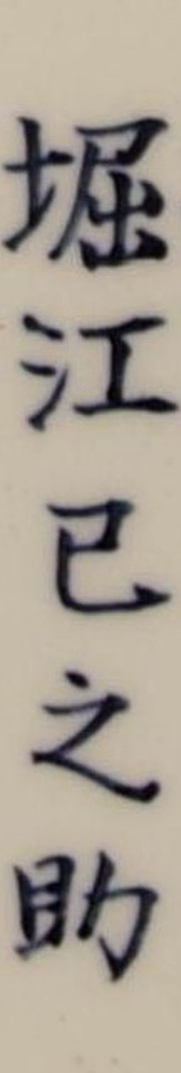堀江巳之助
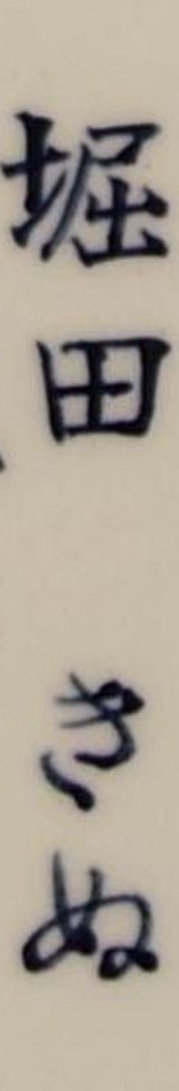堀田きぬ
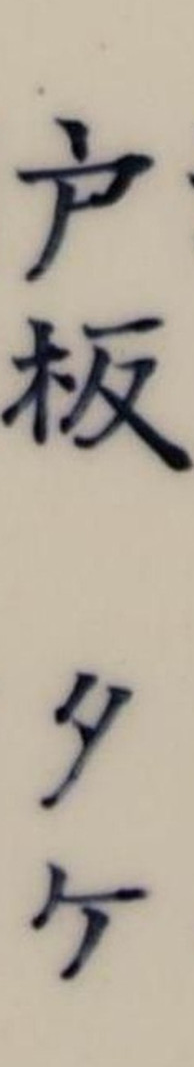戸板タケ
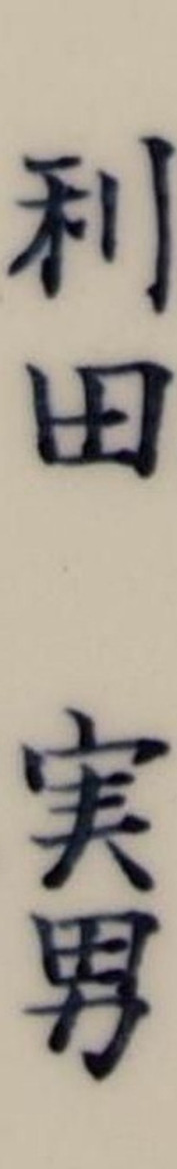利田実男
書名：M~S
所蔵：高野山金剛峯寺
